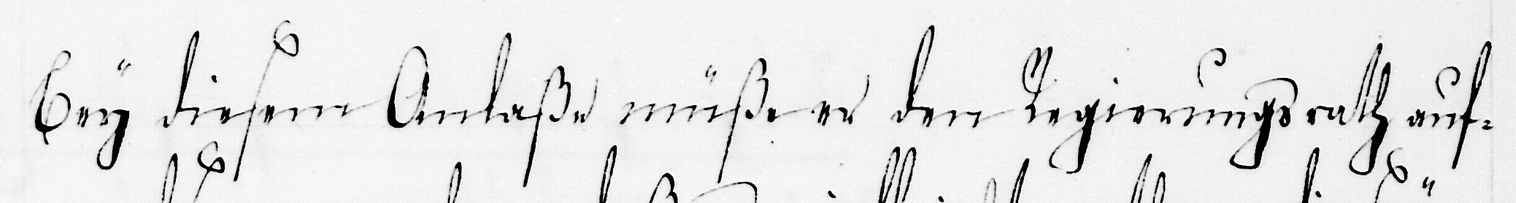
Bey diesem Anlaße müße er den Regierungsrath auf¬
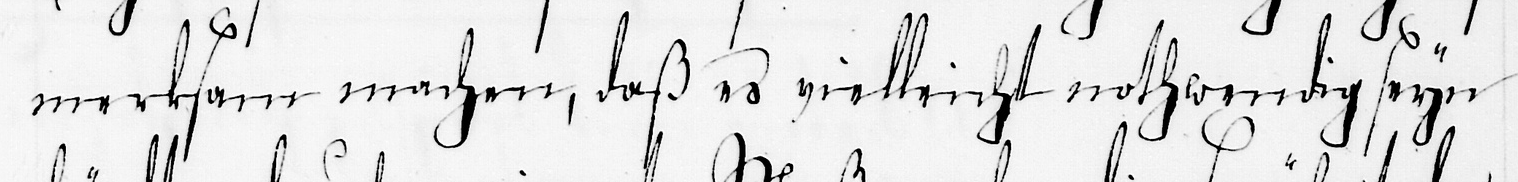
merksam machen, daß es vielleicht nothwendig seyn
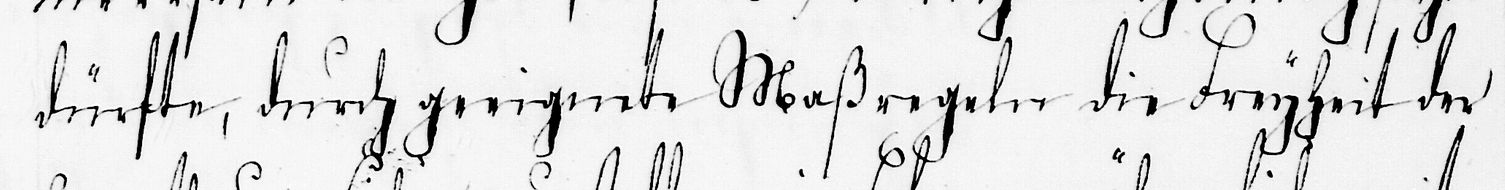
dürfte, durch geeignete Maßregeln die Freyheit der
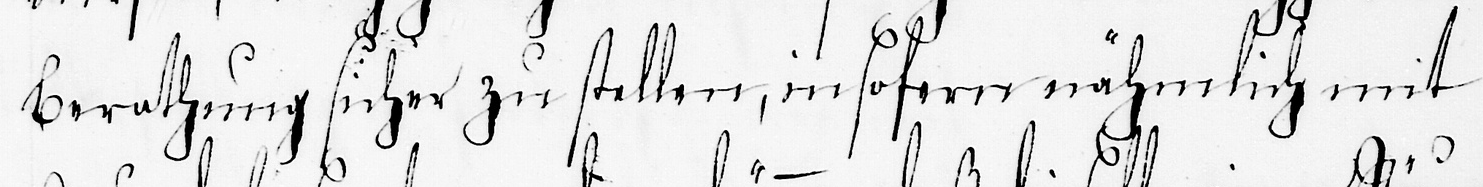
Berathung sicher zu stellen, in sofern nähmlich mit
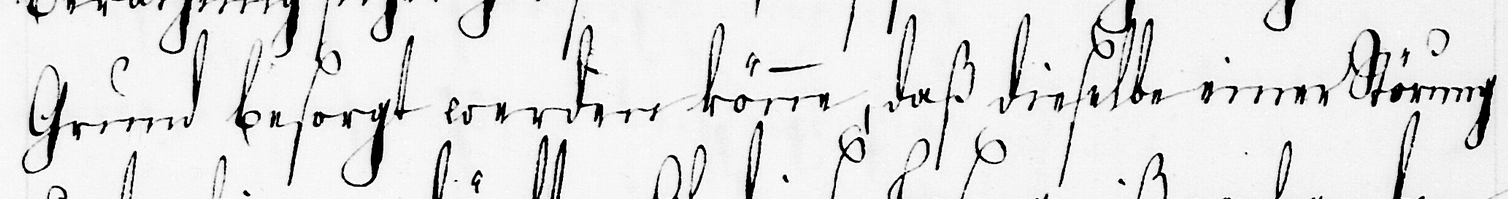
Grund besorgt werden könne, daß dieselbe einer Störung
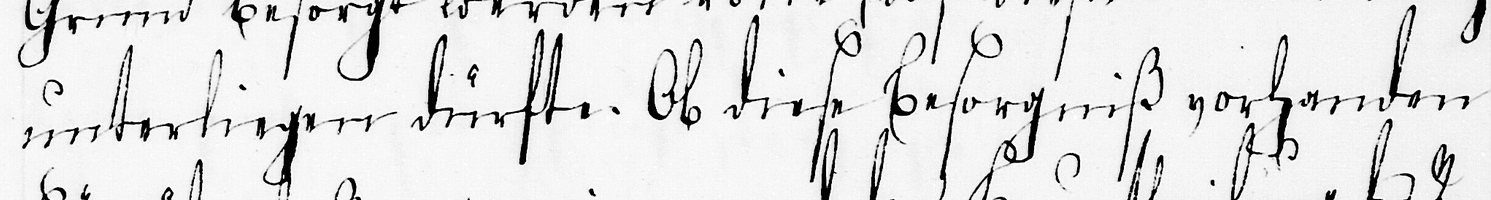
unterliegen dürfte. Ob diese Besorgniß vorhanden
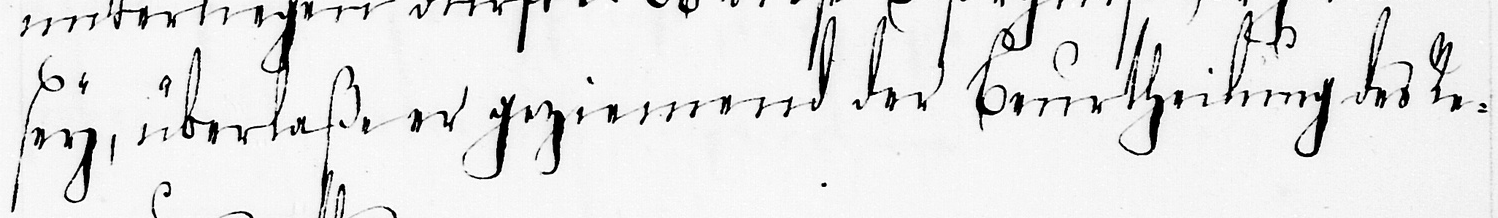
sey, überlaße er geziemend der Beurtheilung des Re¬
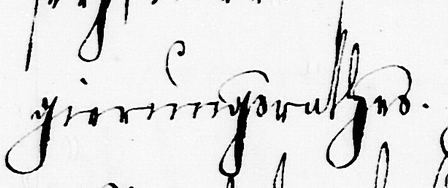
gierungsrathes.
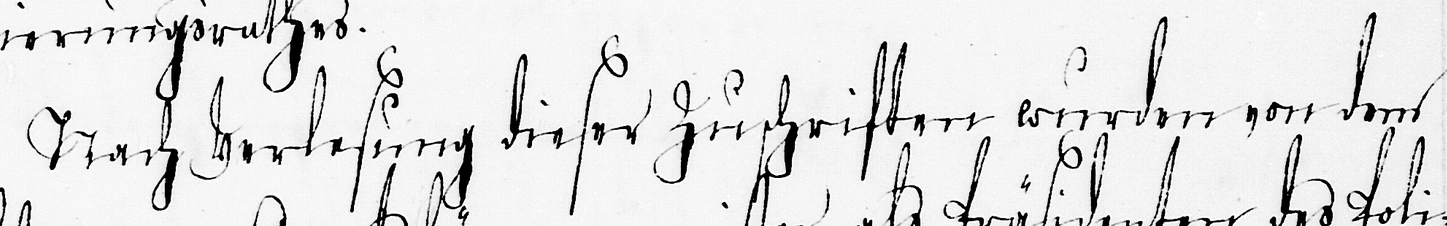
Nach Verlesung dieser Zuschriften wurden von dem
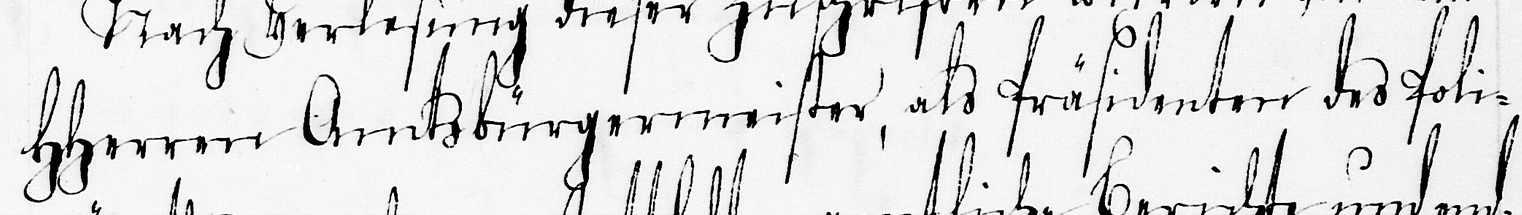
HHerren Amtsbürgermeister, als Präsidenten des Poli¬
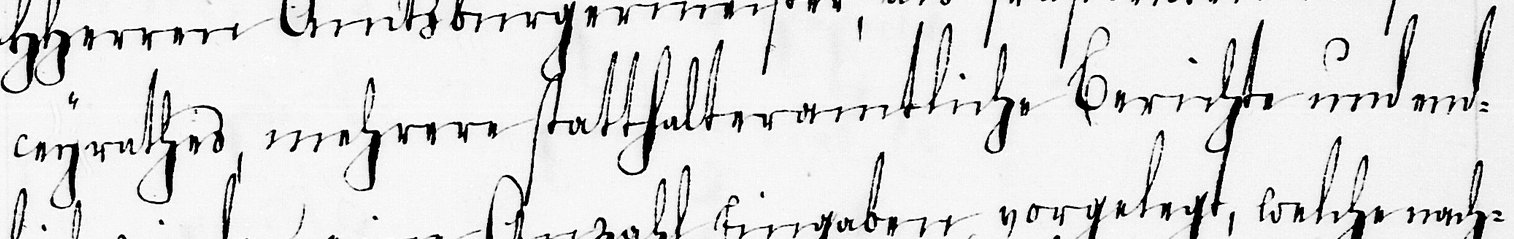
ceyrathes, mehrere statthalteramtliche Berichte und end¬
